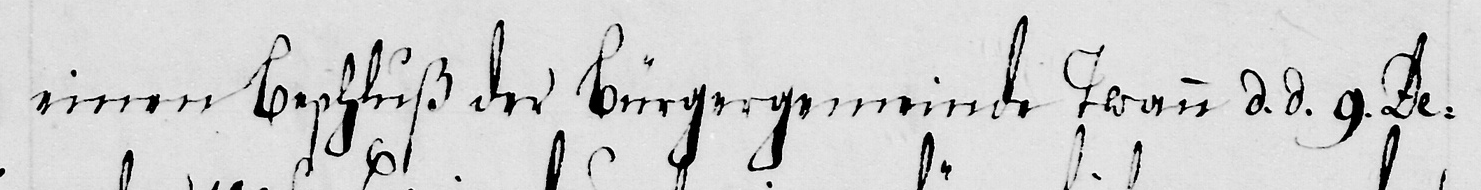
einen Beschluß der Bürgergemeinde Twann d. d. 9. De¬
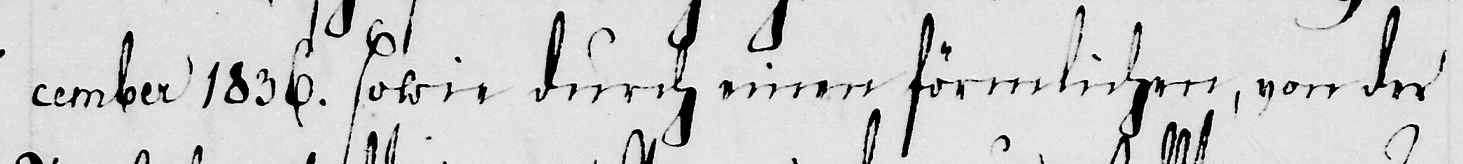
cember 1836. sowie durch einen förmlichen, von der
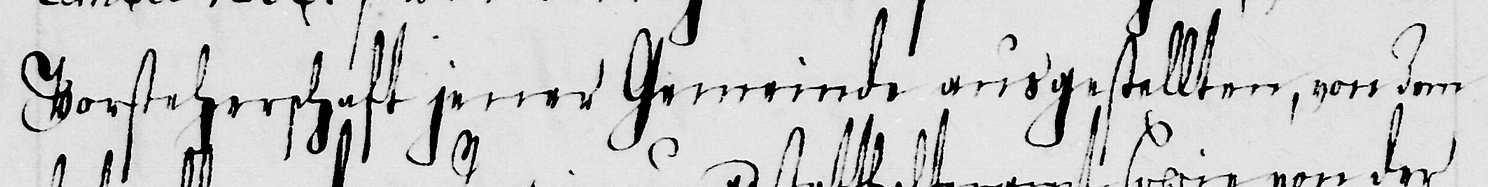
Vorsteherschaft jener Gemeinde ausgestellten, von dem
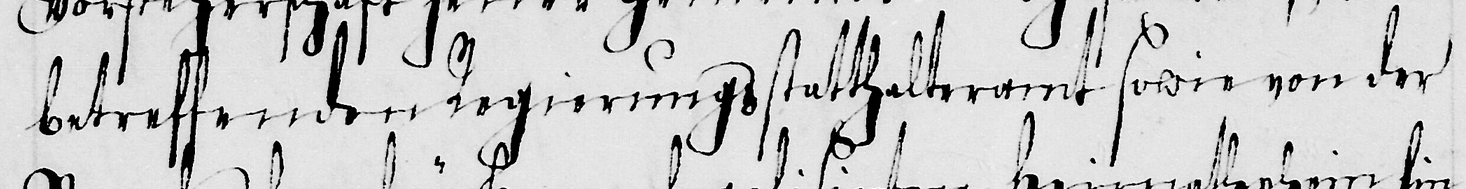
betreffenden Regierungsstatthalteramt sowie von der
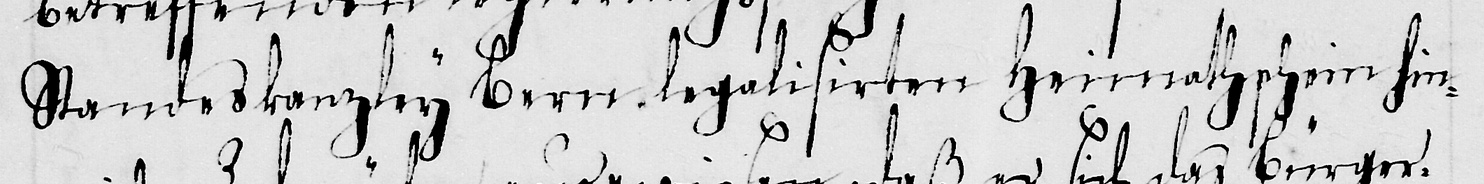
Standeskanzley Bern legalisierten Heimathschein hin¬
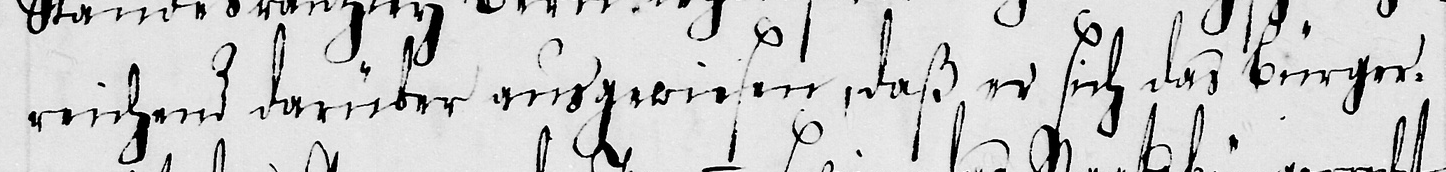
reichend darüber ausgewiesen, daß er sich das Bürger¬
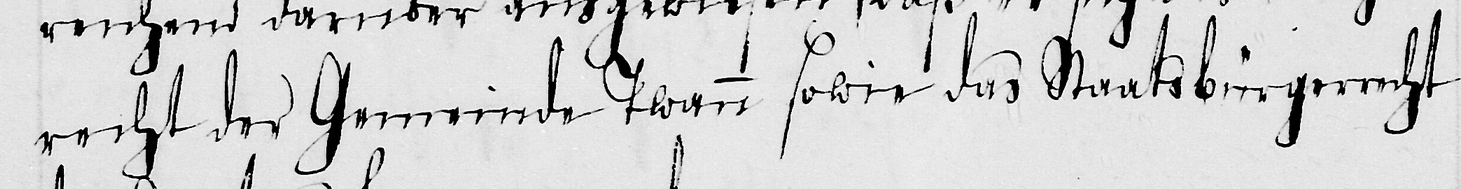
recht der Gemeinde Twann sowie das Staatsbürgerrecht
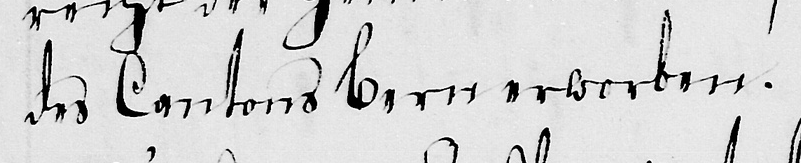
des Cantons Bern erworben.
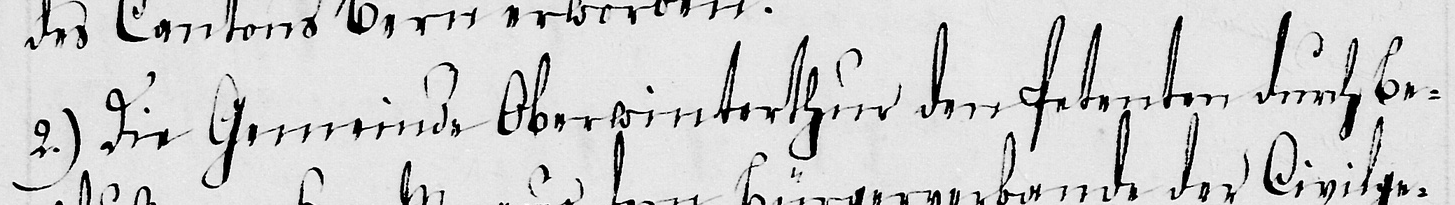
2.) Die Gemeinde Oberwinterthur den Petenten durch Be¬
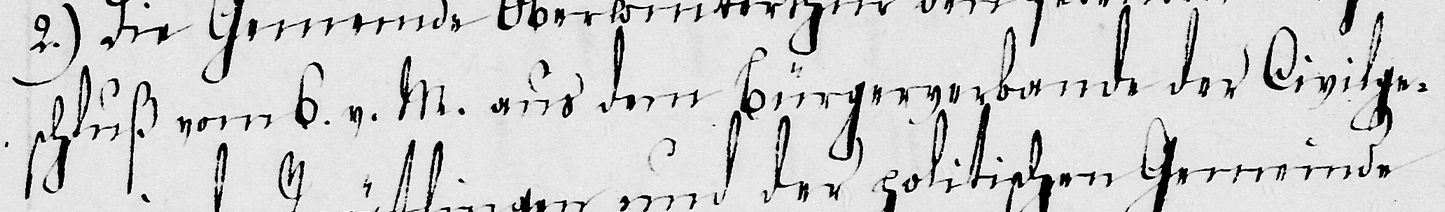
schluß vom 6. v. M. aus dem Bürgerverbande der Civilge¬
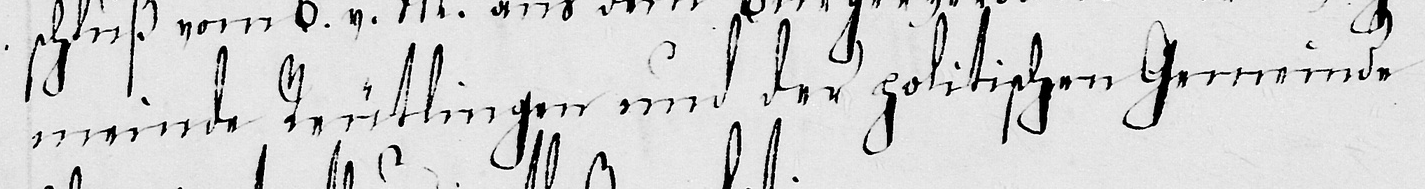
meinde Reutlingen und der politischen Gemeinde
